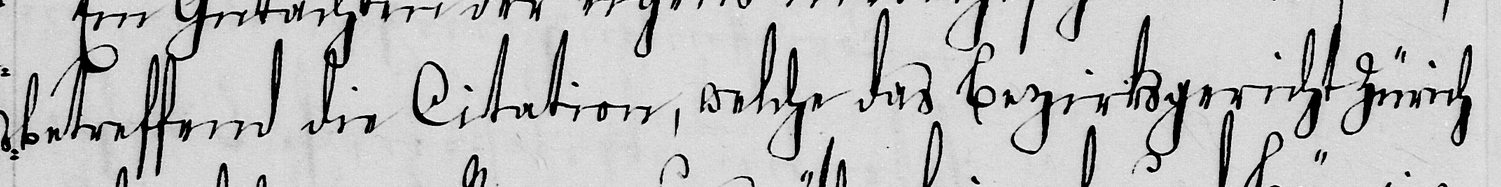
betreffend die Citation, welche das Bezirksgericht Zürich
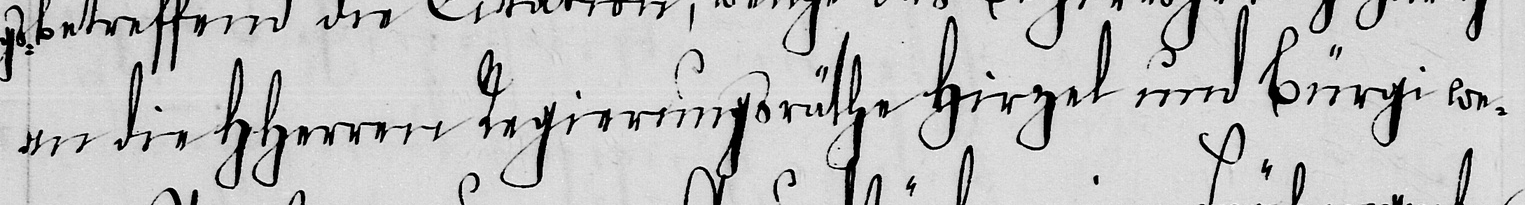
an die HHerren Regierungsräthe Hirzel und Bürgi we¬
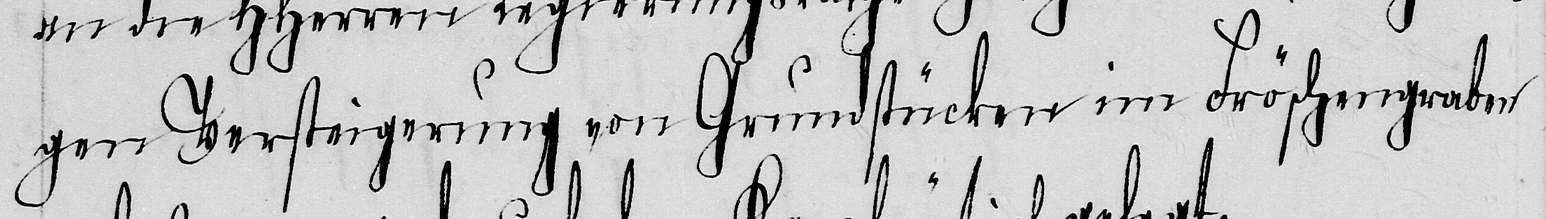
gen Versteigerung von Grundstücken im Fröschengraben
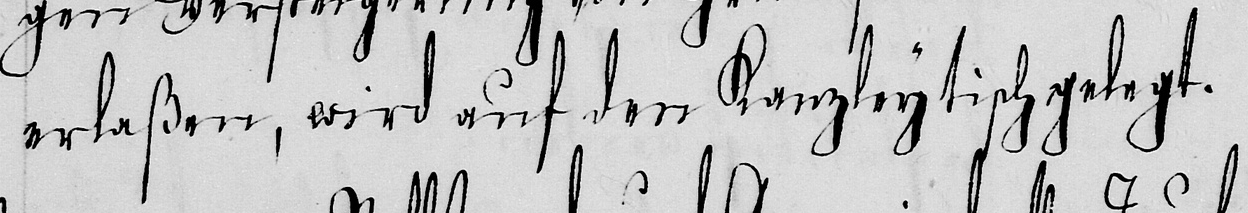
erlaßen, wird auf den Kanzleytisch gelegt.
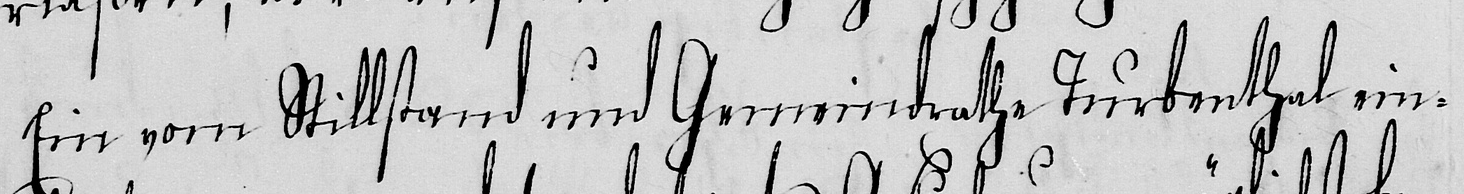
Ein vom Stillstand und Gemeindrathe Turbenthal ein¬
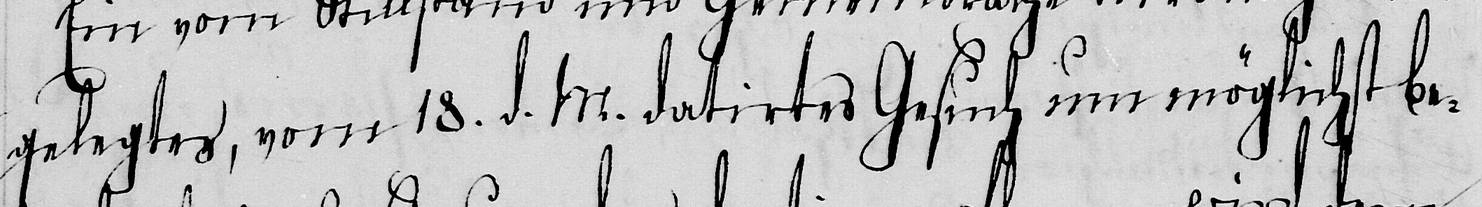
gelegtes, vom 18. d. M. datirtes Gesuch um möglichst be¬
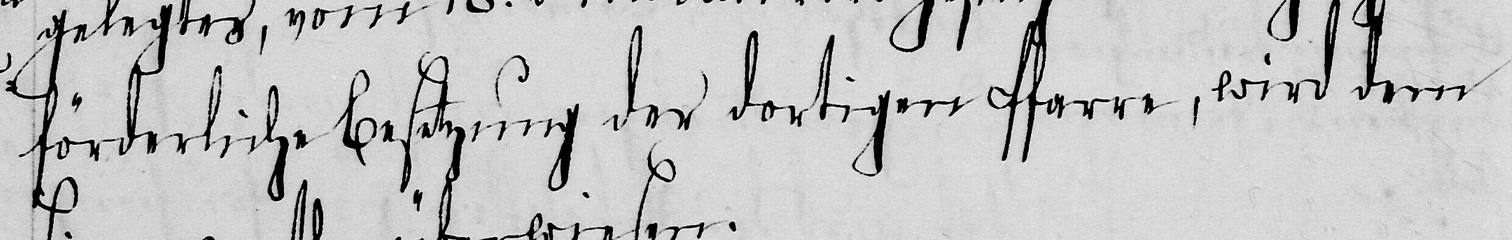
förderliche Besetzung der dortigen Pfarre, wird dem
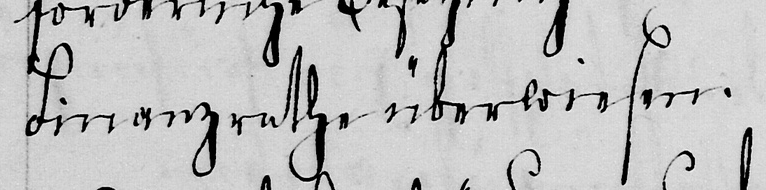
Finanzrathe überwiesen.
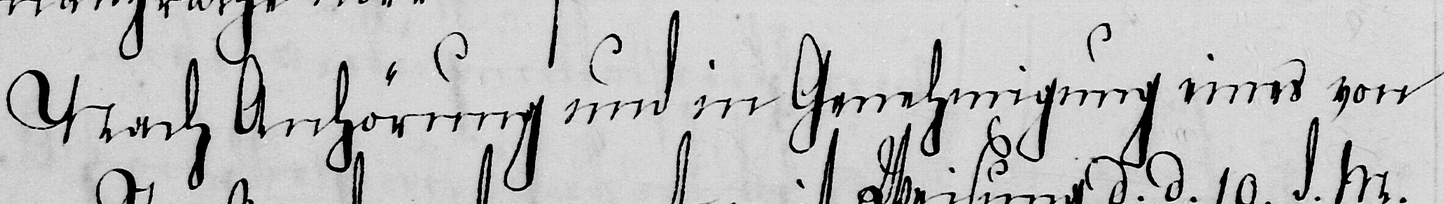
Nach Anhörung und in Genehmigung eines von
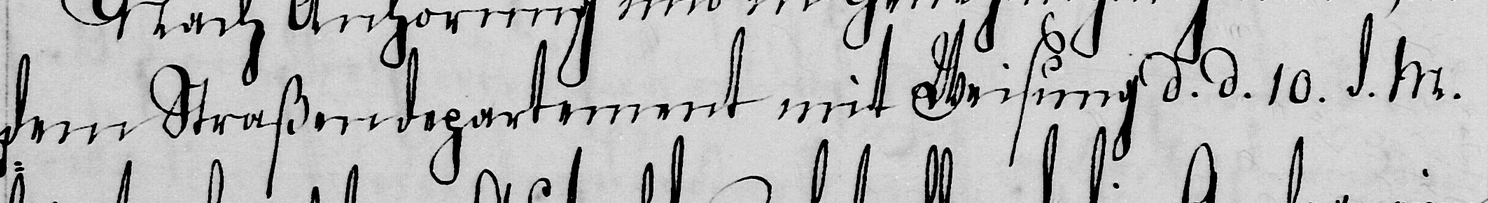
dem Straßendepartement mit Weisung d. d. 10. d. M.
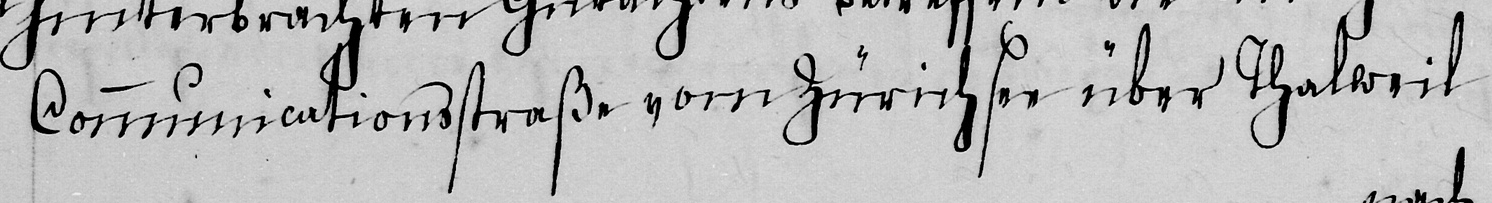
Communicationsstraße vom Zürichsee über Thalweil
